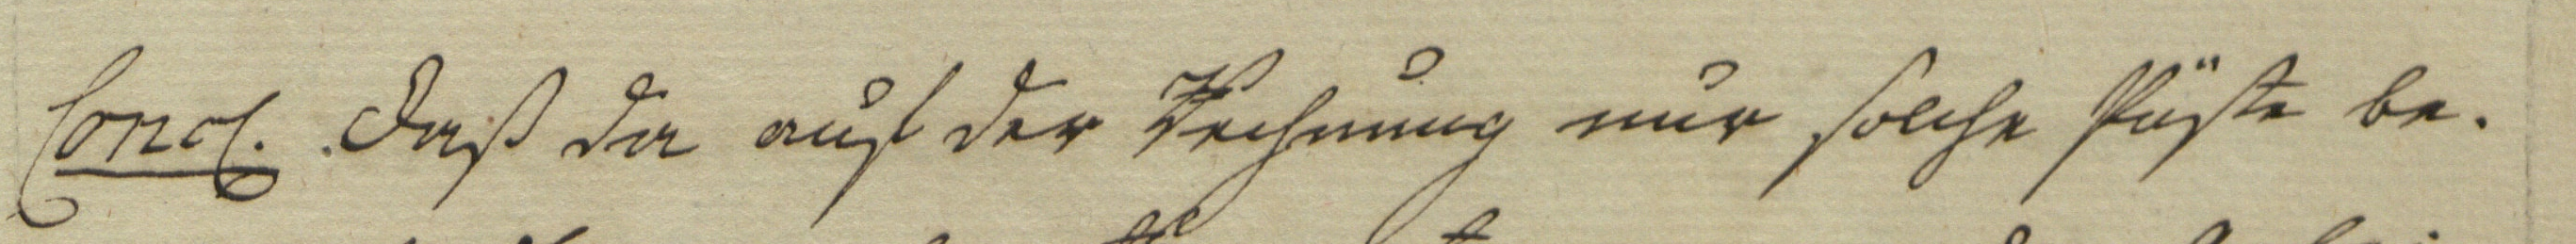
Concl. Daß da auf der Rechnung nur solche Pöste be¬
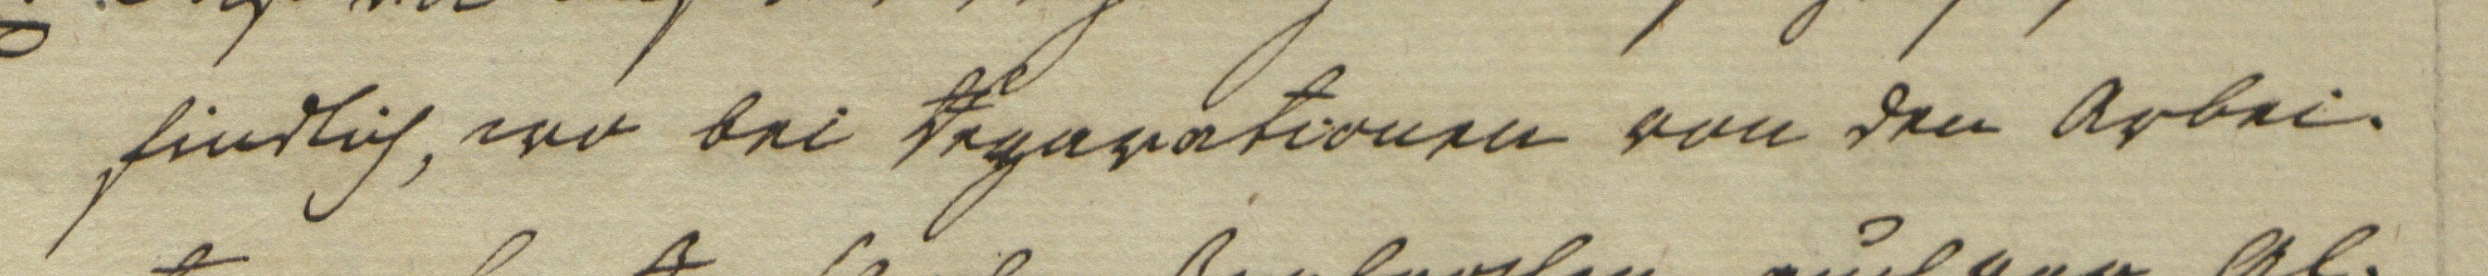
findlich, wo bei Reparationen von den Arbei¬
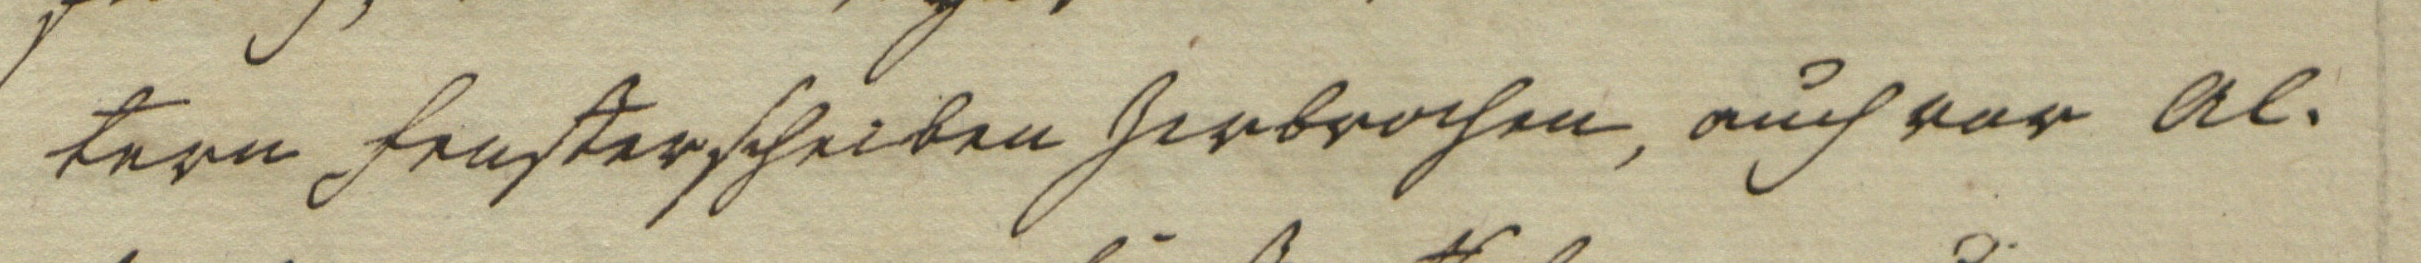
tenn Fensterscheiben zerbrochen, auch vor Al¬
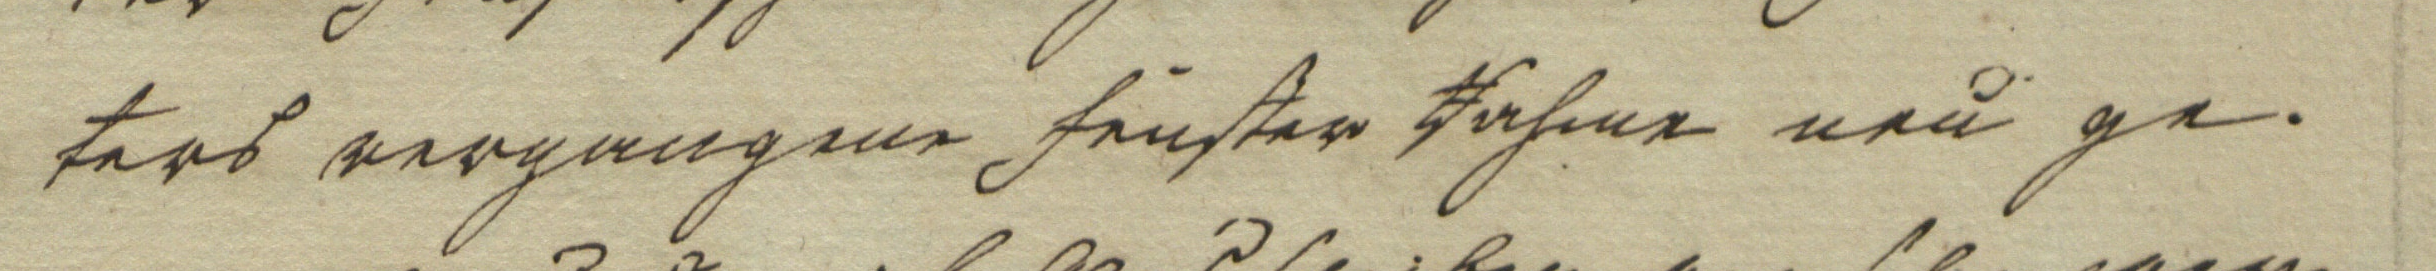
ters vergangene Fenster Rahme neu ge¬
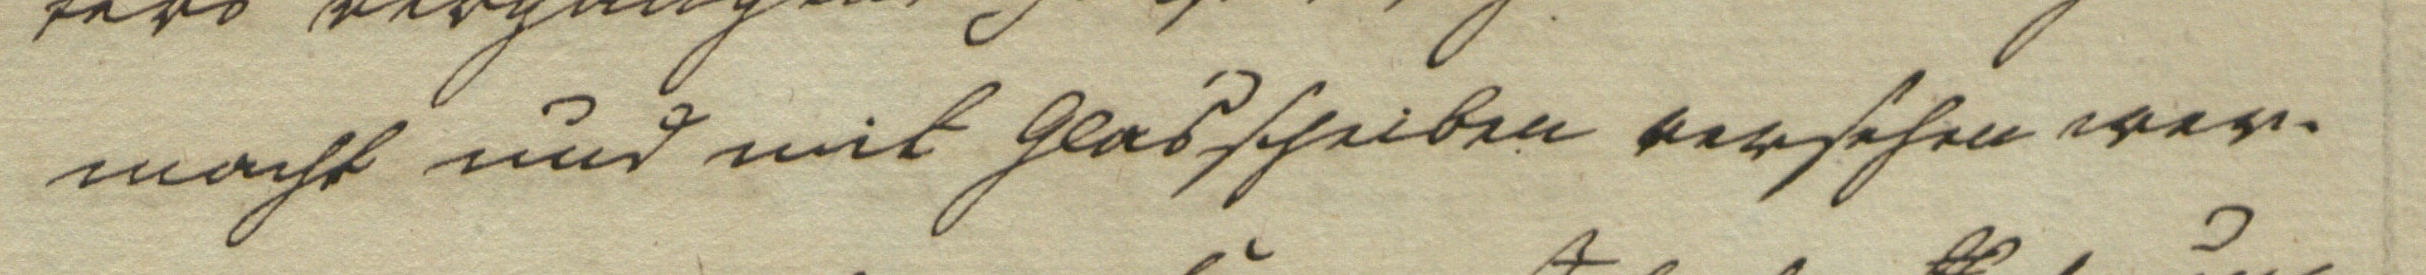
macht und mit Glasscheiben versehen wer¬
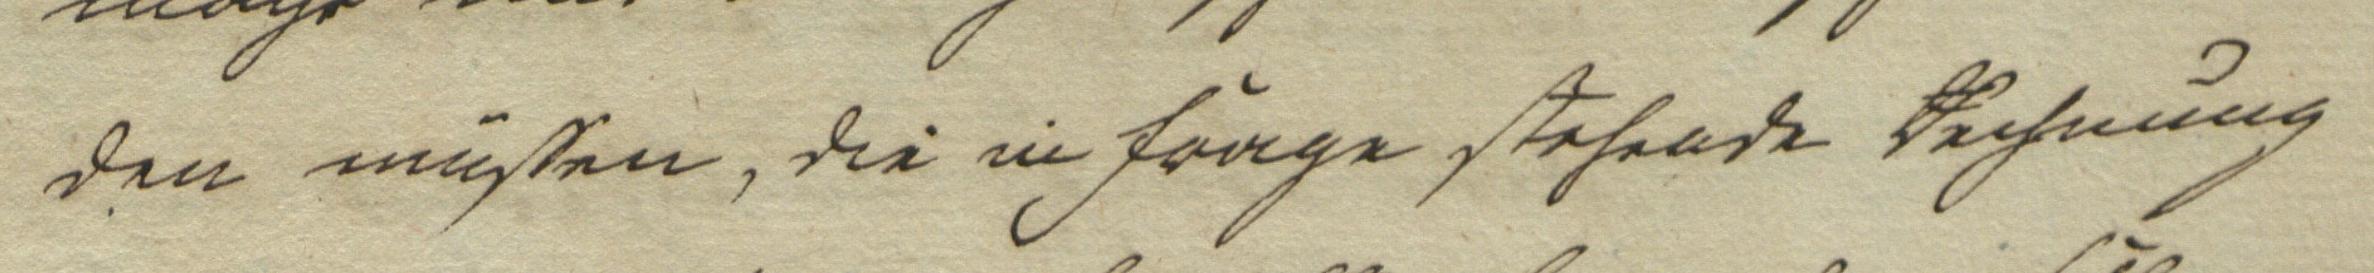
den müssen, die in Frage stehende Rechnung
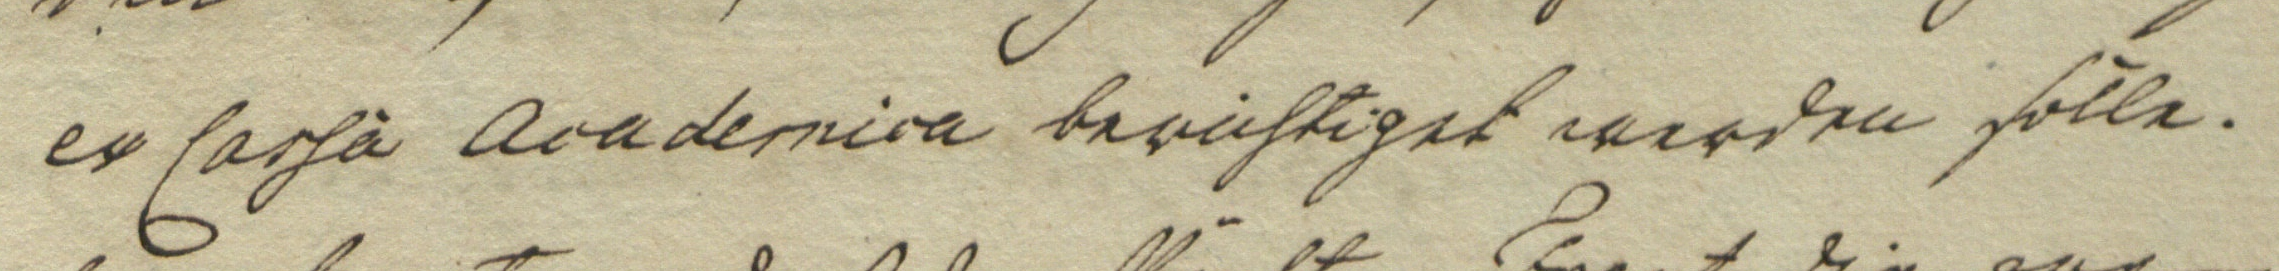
ex Cassa Academica berichtiget werden solle.
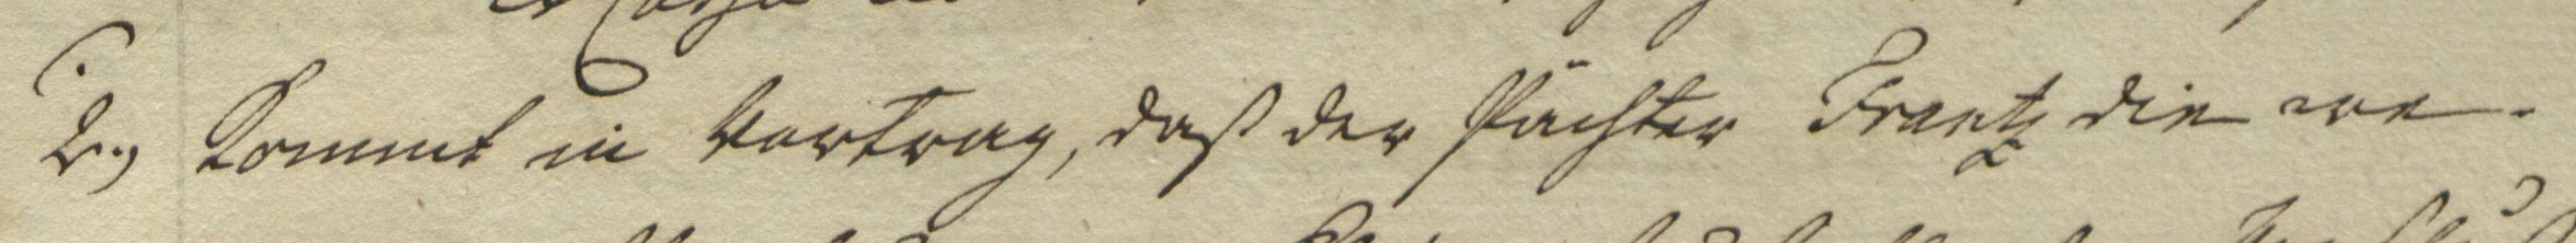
2., Kommt in Vortrag, daß der Pächter Frantz die we¬
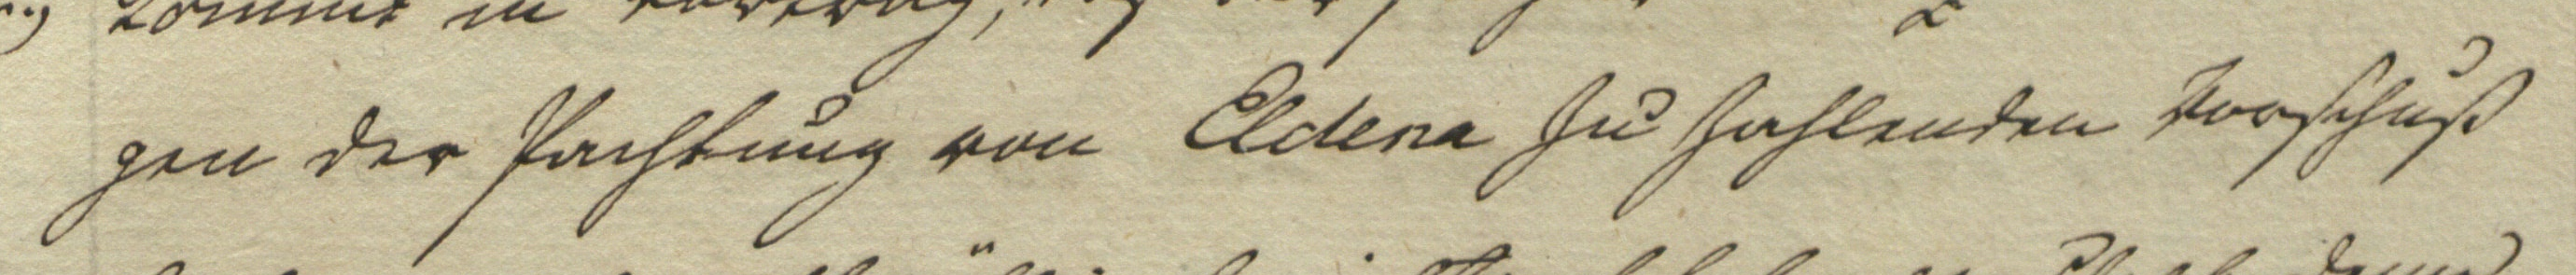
gen der Pachtung von Eldena zu zahlenden Vorschuß
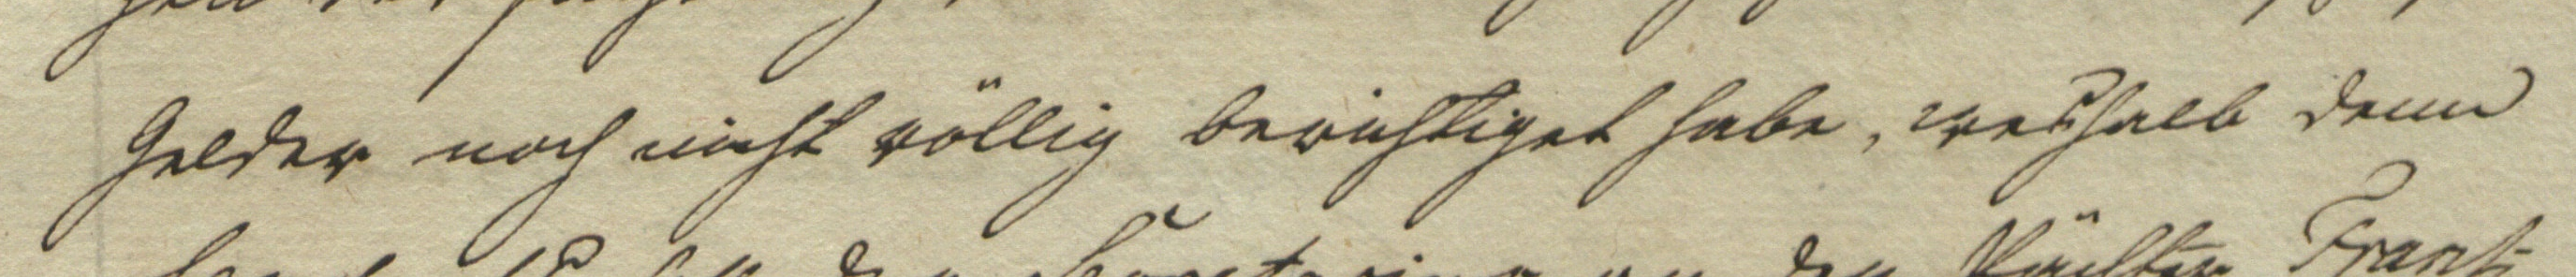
Gelder noch nicht völlig berichtiget habe, weshalb denn
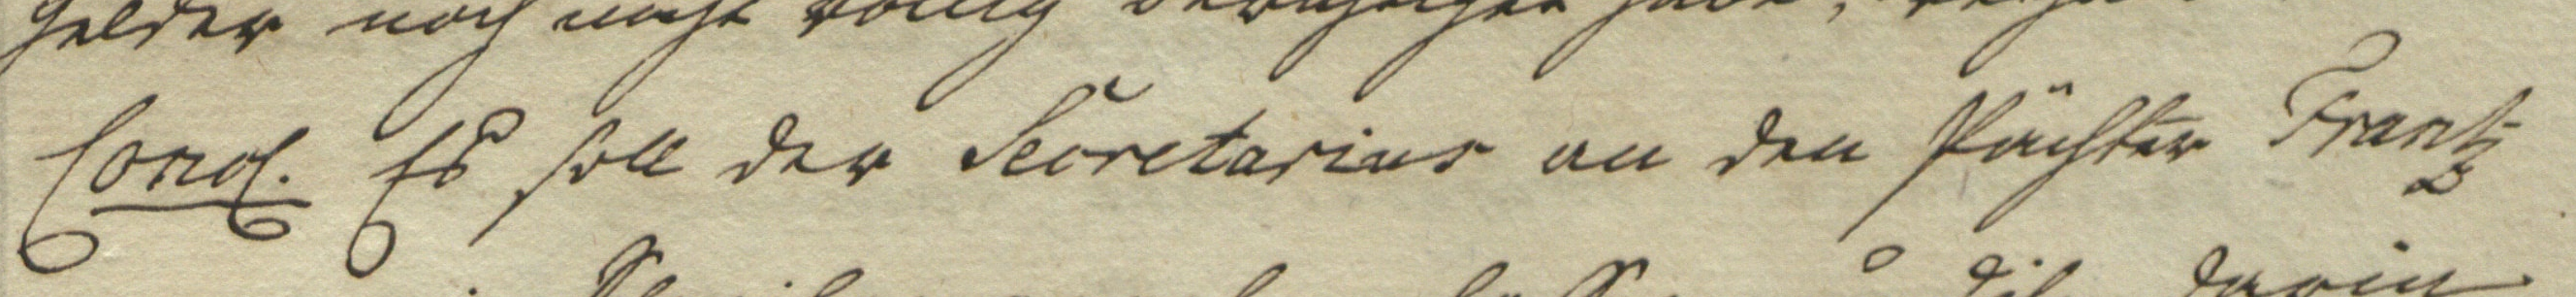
Concl. Es soll der Secretarius an den Pächter Frantz
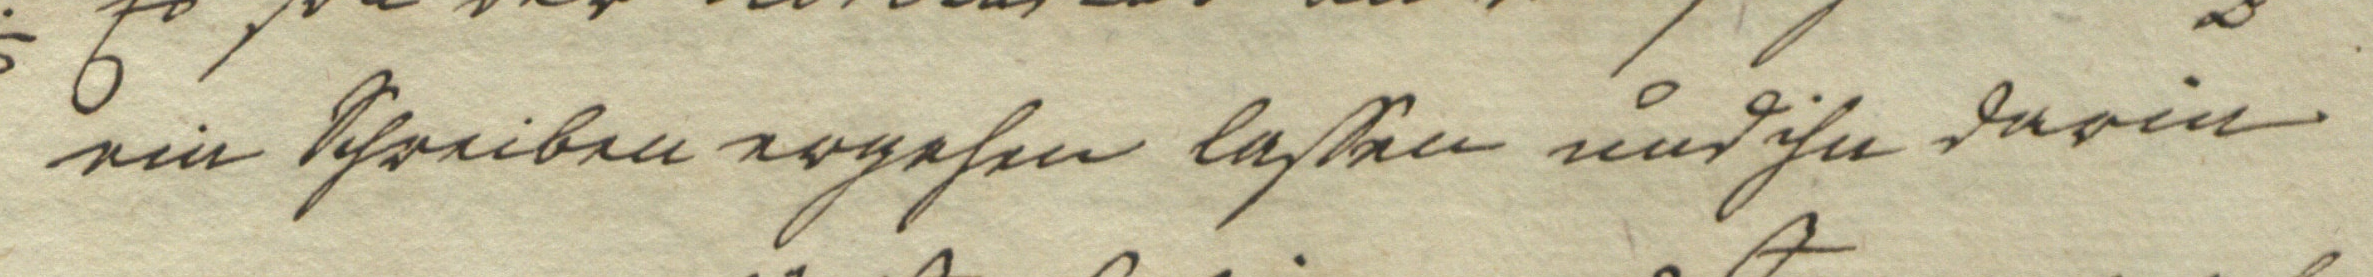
ein Schreiben ergehen lassen und ihn darin
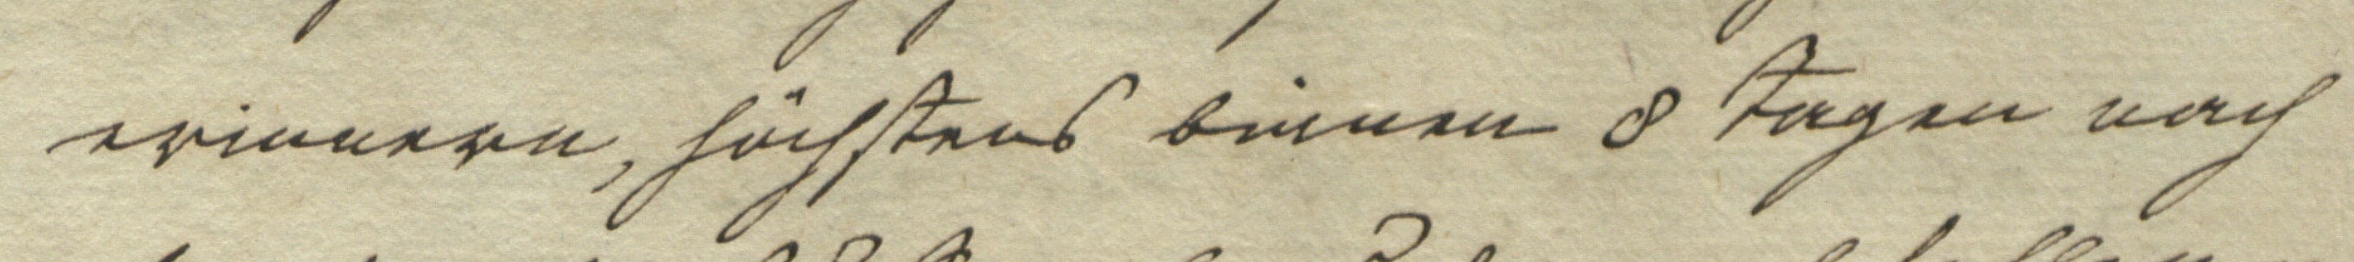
erinnern, höchstens binnen 8 Tagen nach
